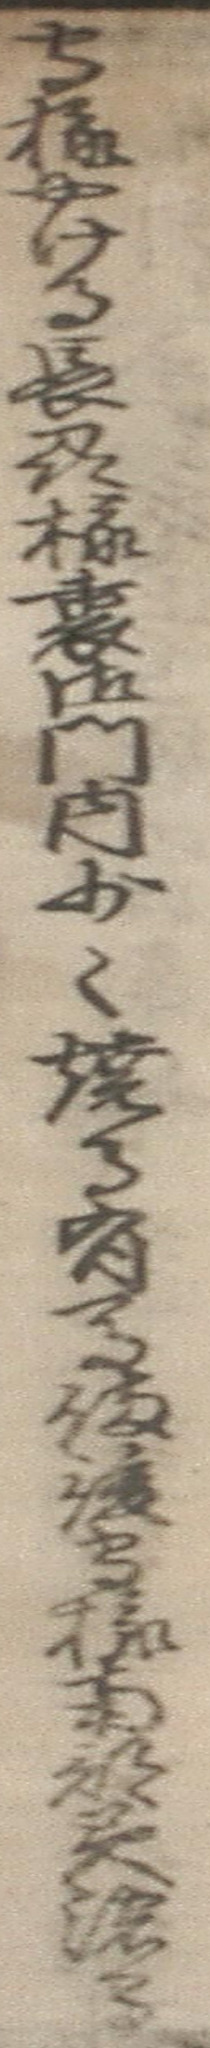守様やける長州様裏御門内少〻焼る有馬備後守様南部美濃守
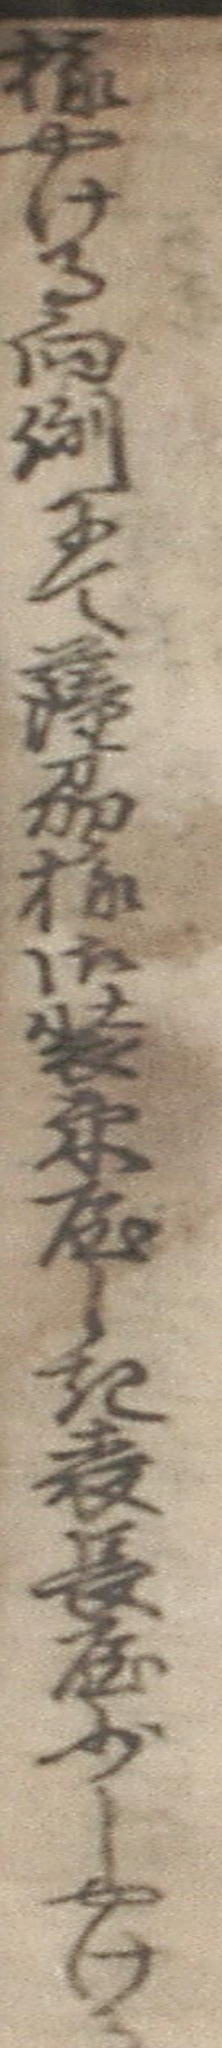様やける向側にて薩州様御装束屋しき表長家少しやける幸ばし
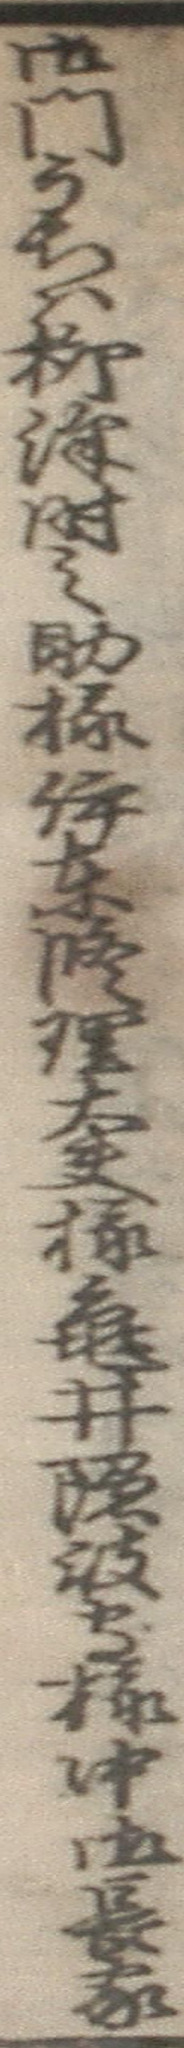御門うちは柳沢時之助様伊東修理大夫様亀井隠岐守様中御長家
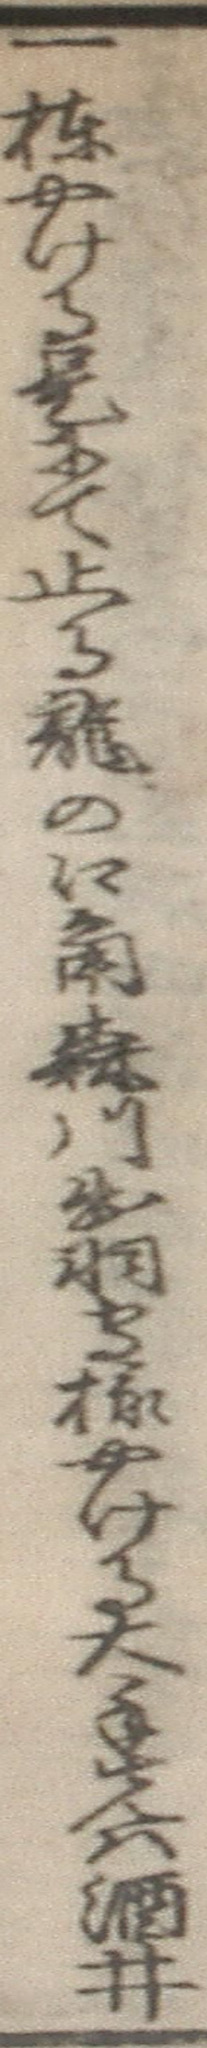一棟やける是にて止る龍の口角森川出羽守様やける大手先は酒井
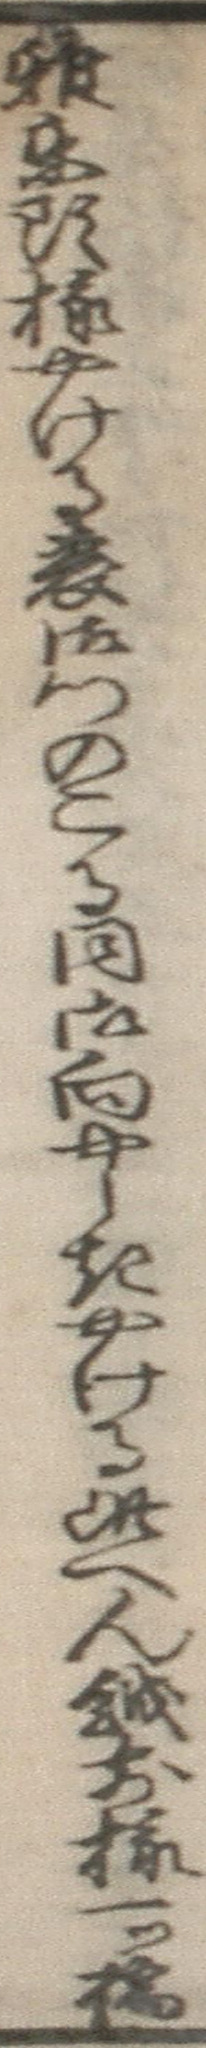雅楽頭様やける表御門のこる同御向やしきやける此へん越前様一ツ橋
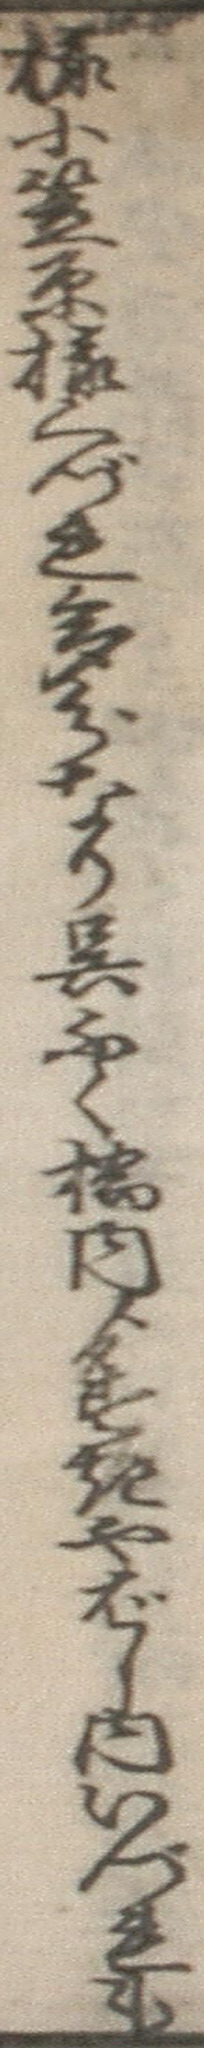様小笠原様くづれ多分なり呉ふく橋内ゟすきやばし内いづれも
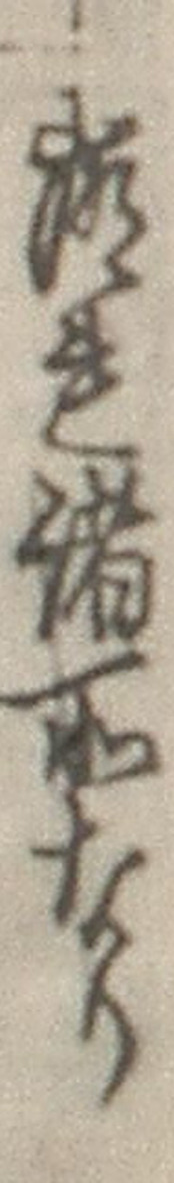崩れ諸所なり
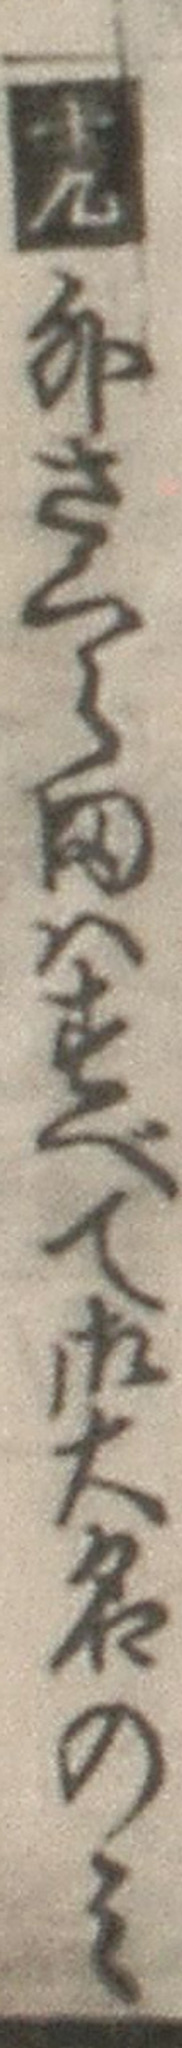十九外さくら田はすべて御大名のみ
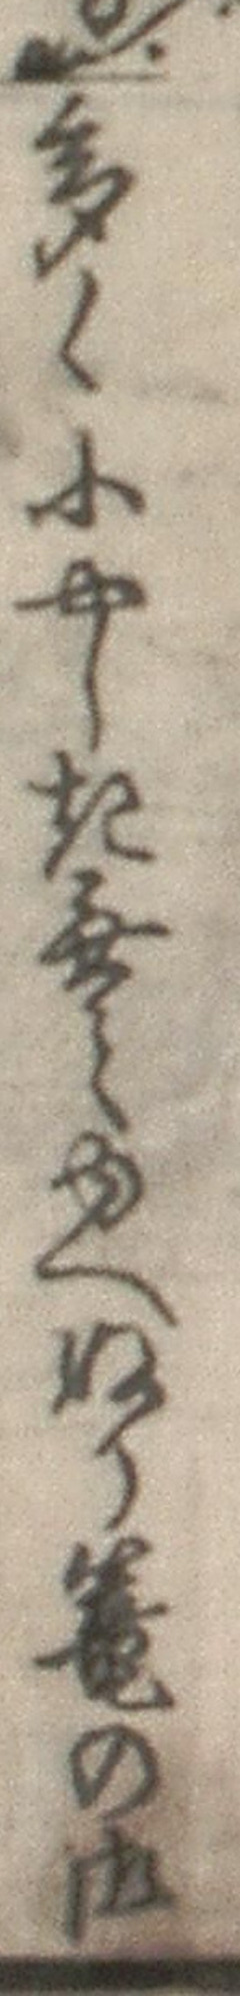多く小やしき無之ゆへぬり篭の御
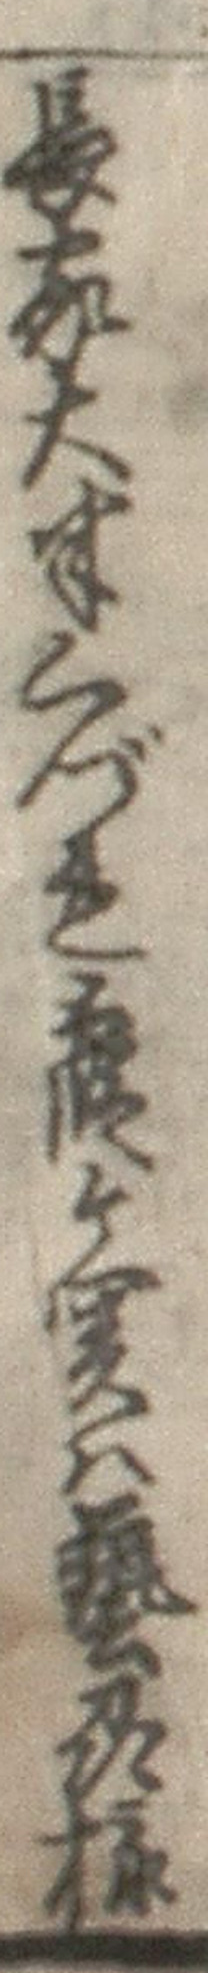長家大半くづれ霞ヶ関は藝州様
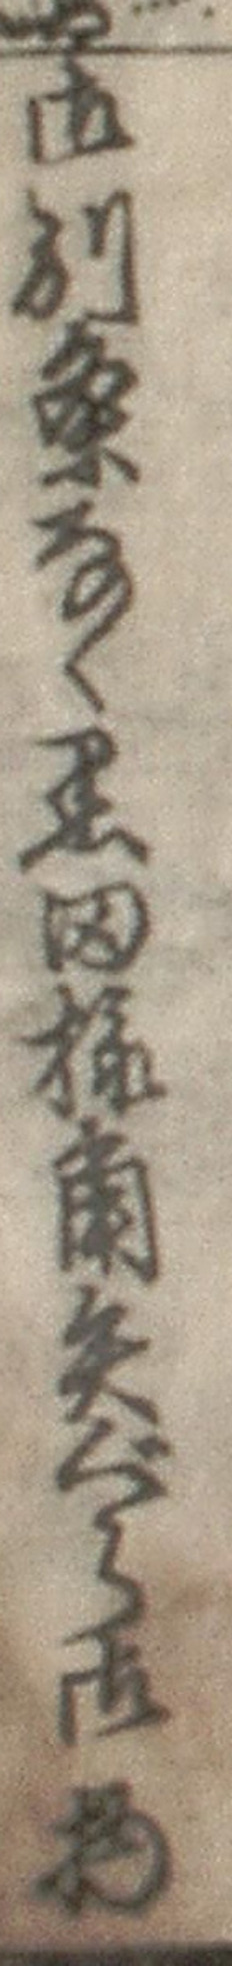御別条なく黒田様角矢ぐら御物
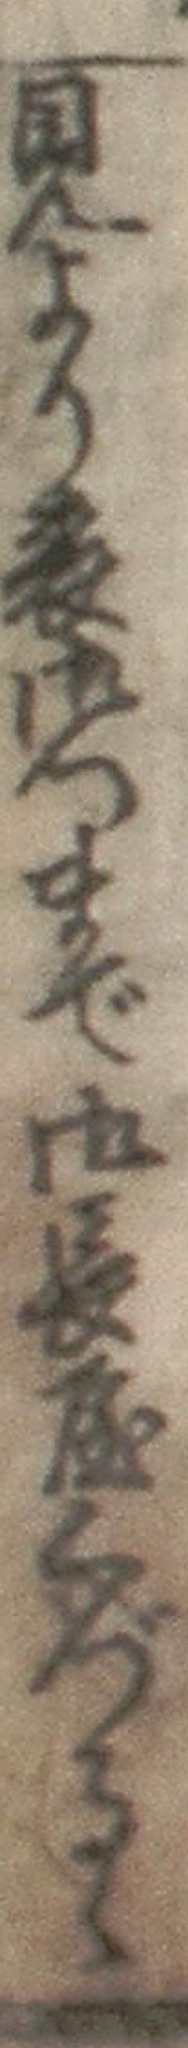見より表御門まで御長家くづるゝ

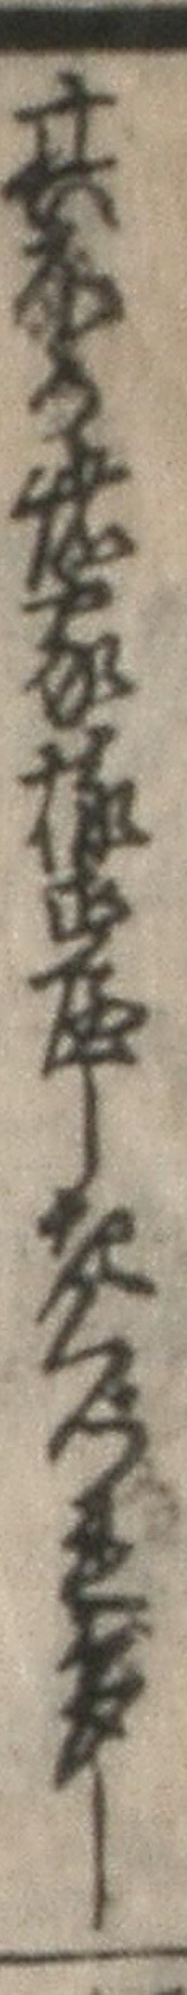其ほか諸家様御屋しきくづれ多し
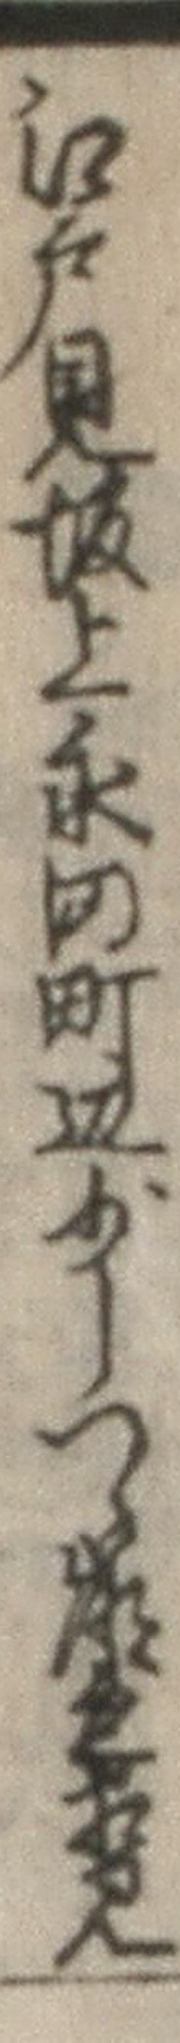江戸見坂上永田町辺少しつゝ崩れ相見
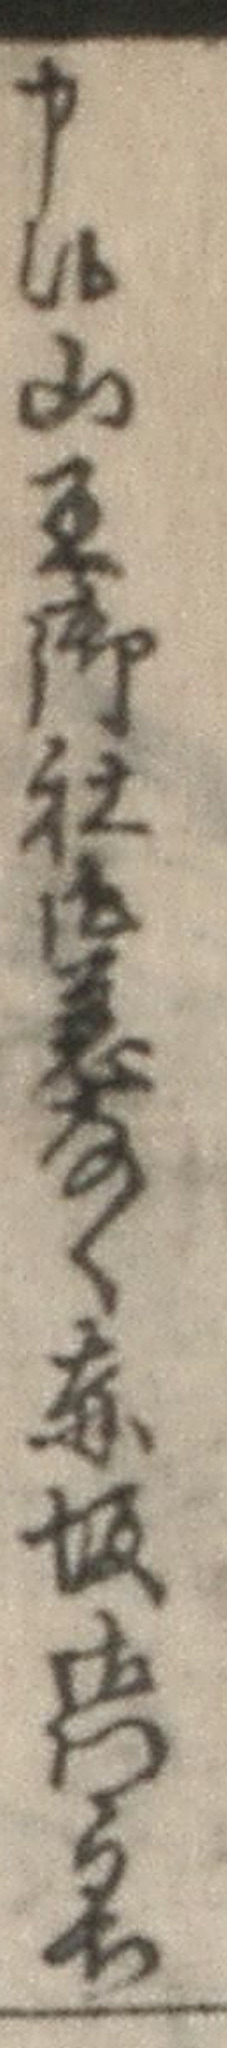申候山王御社御恙なく赤坂御門うち
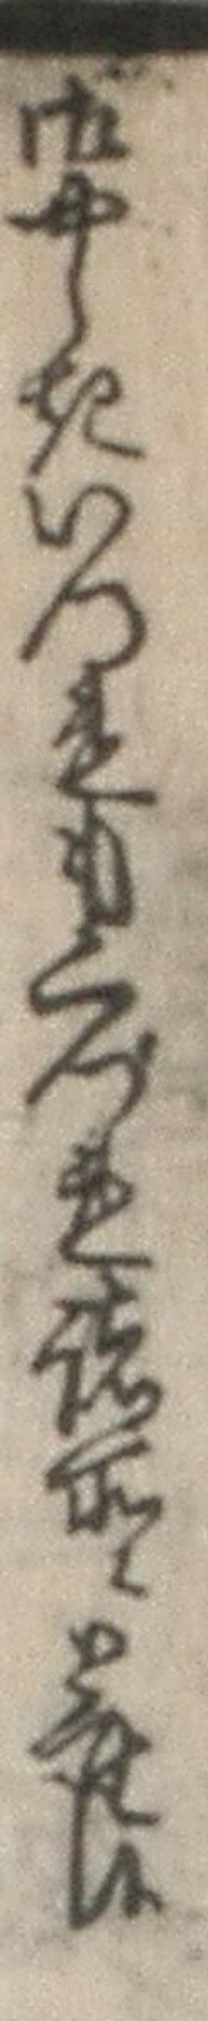御やしきいつれもくづれ諸所〻御座候
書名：江戸大地震末代鑑
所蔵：東京大学地震研究所図書室 Earthquake Research Institute Library, The University of Tokyo, JAPAN
